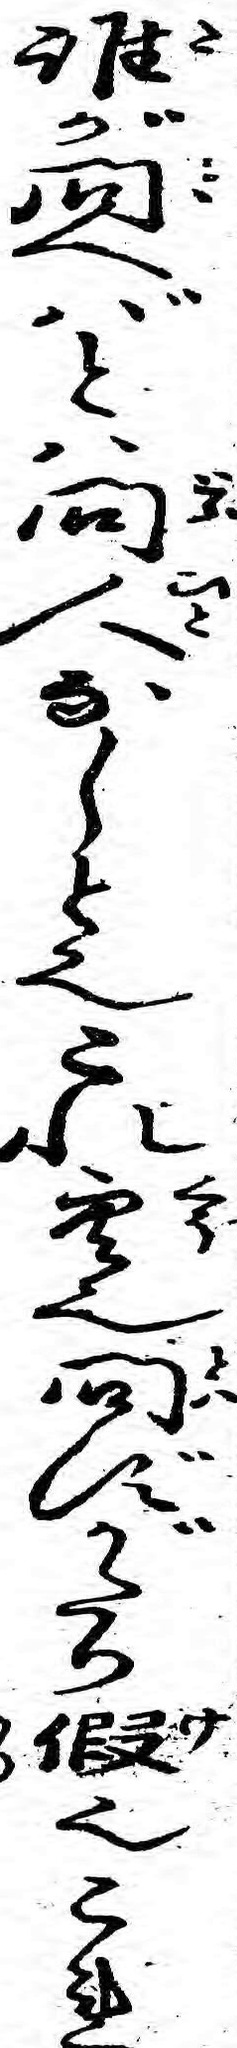誰が問へばとは両人なしと也これ空也問ずがたり仮也これ
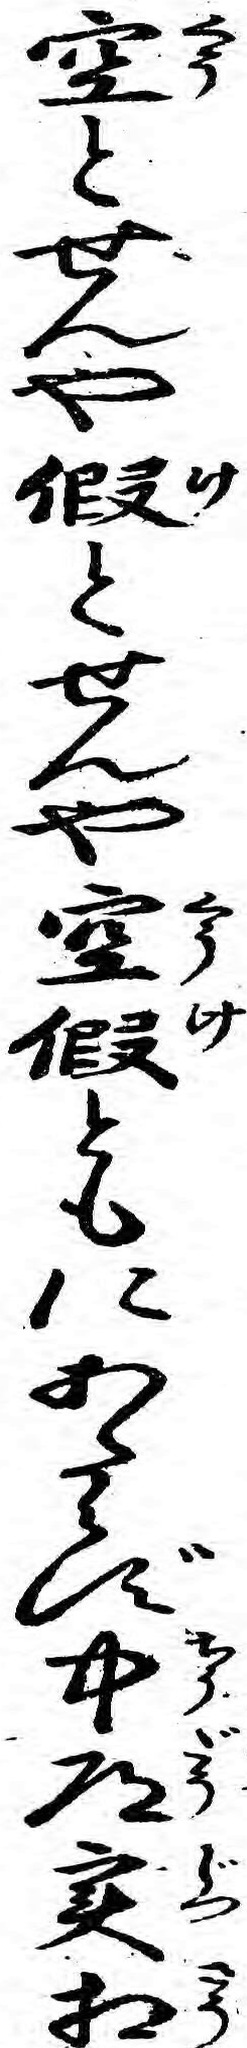空とせんや仮とせんや空仮ともにあたらず中道実相
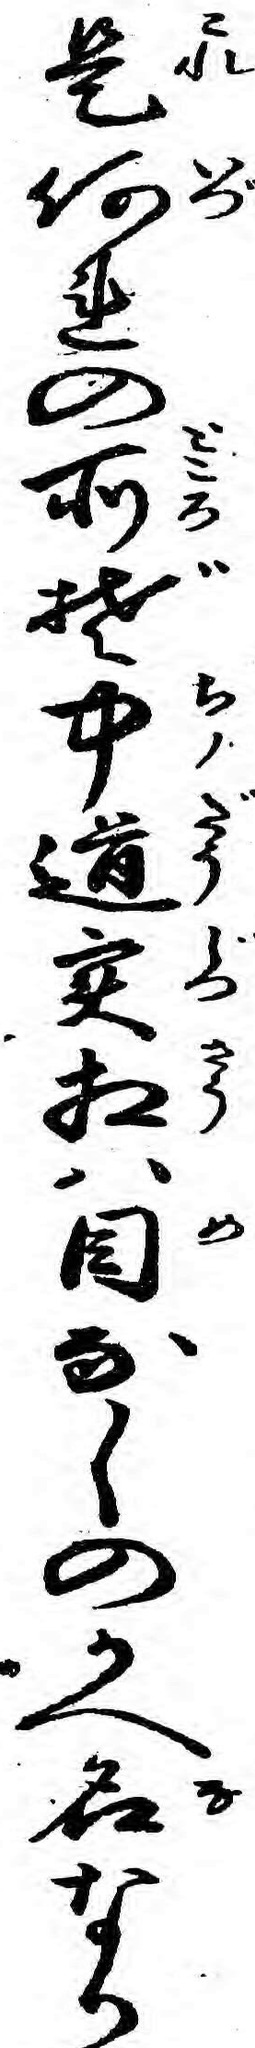是何れの所ぞ中道実相は目なしのかへ名なり
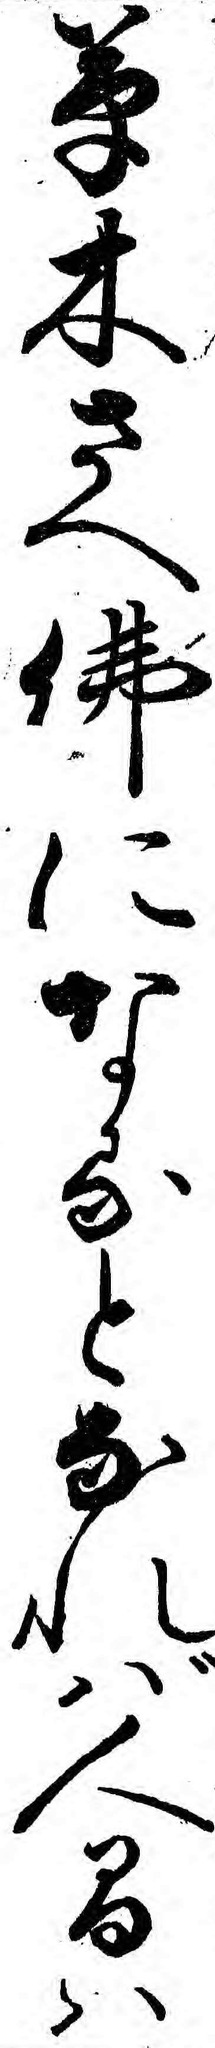草木さへ仏になるとなれば人間は
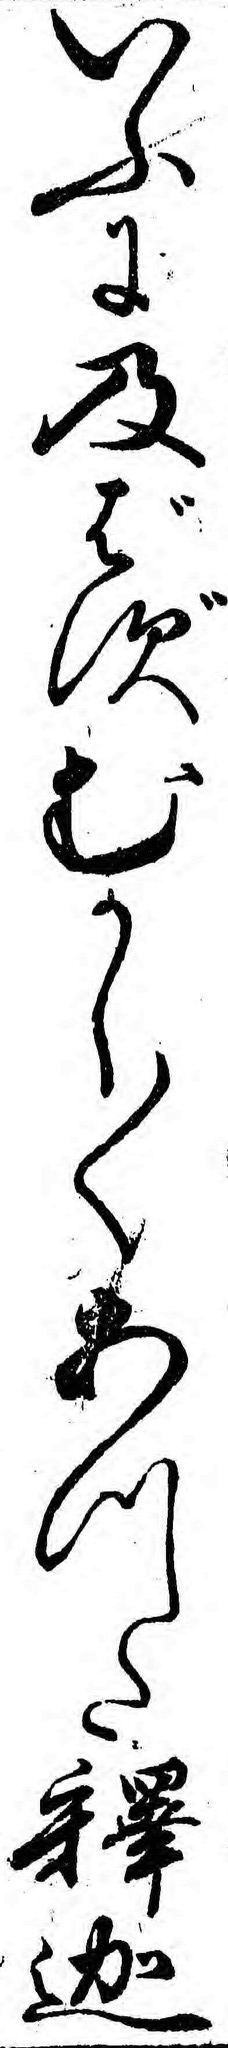いふに及ばずむかし〳〵あつた釈迦
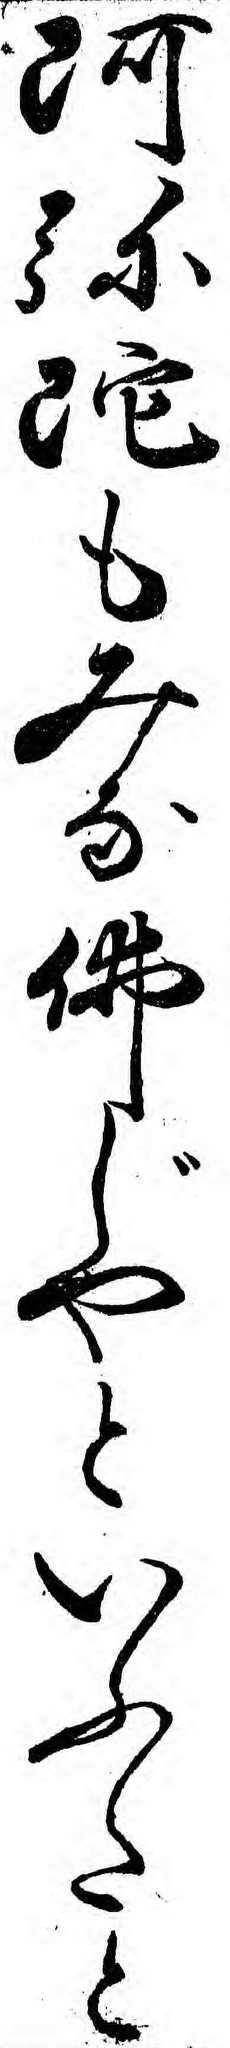阿弥陀もみな仏じやといふたと
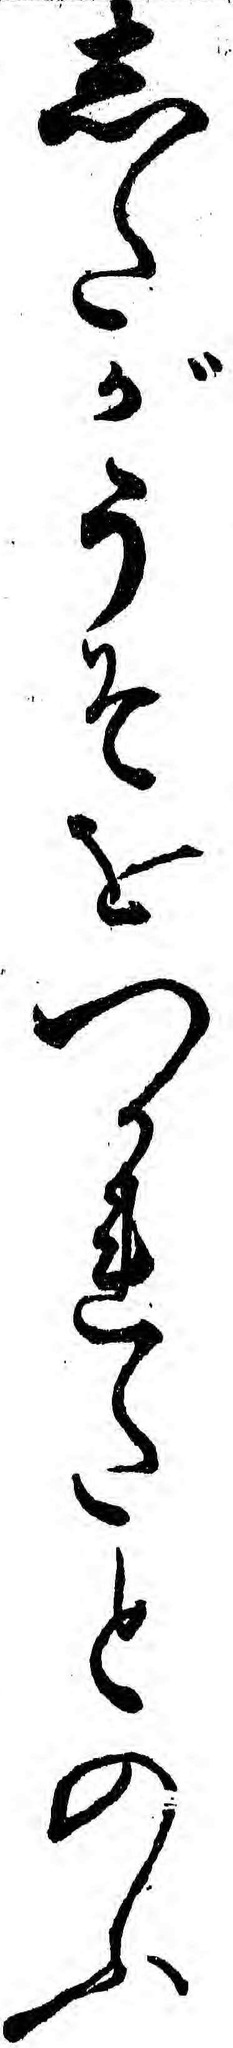したがうそをつかれたとのふ

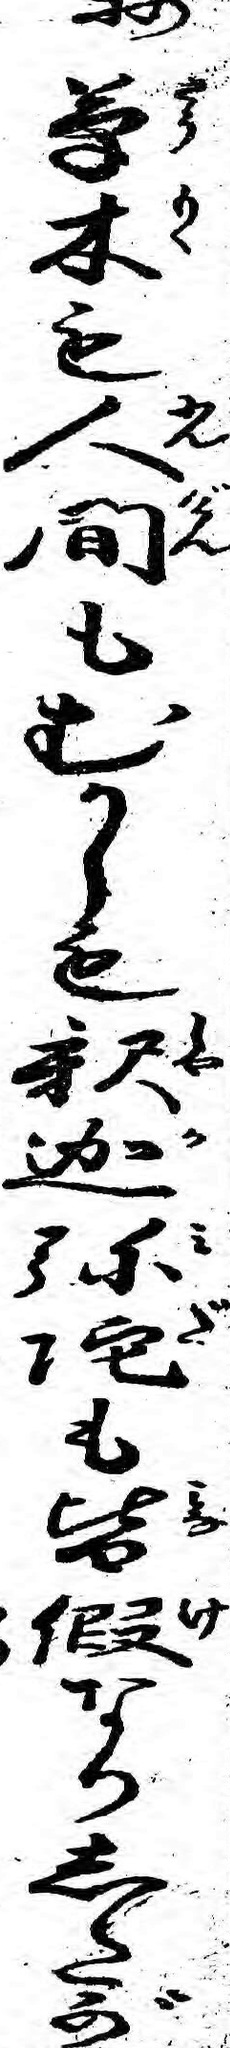草木も人間もむかしも釈迦弥陀も皆仮なりしたが
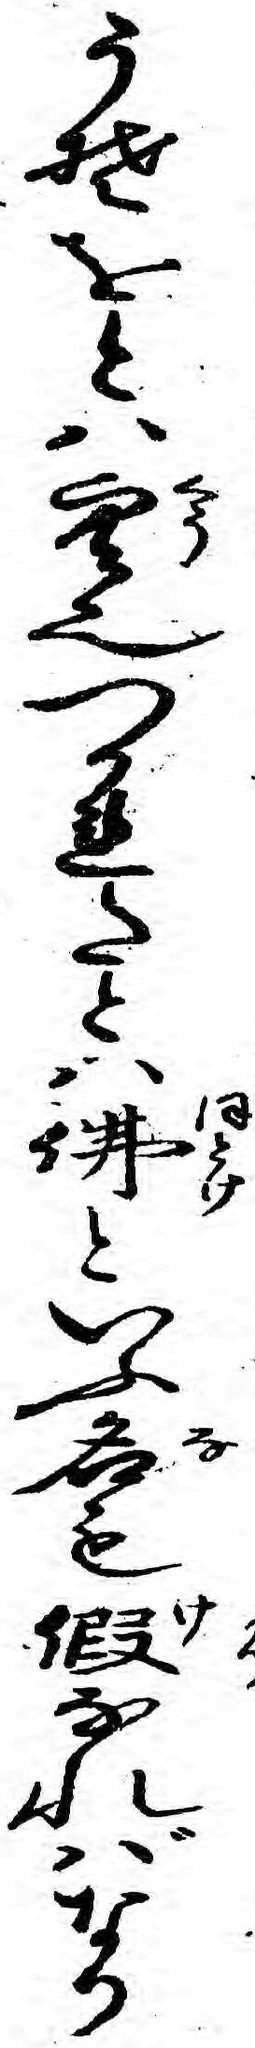うそをとは空也つかれたとは仏といふ名も仮なればなり
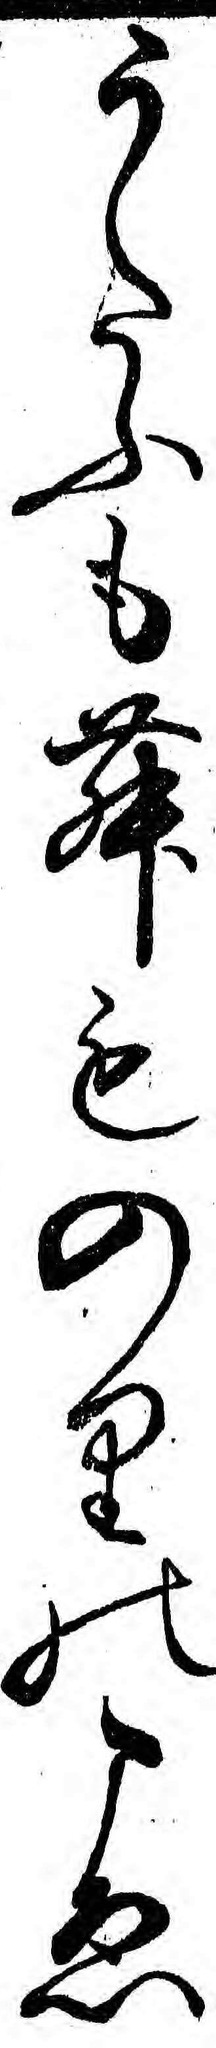うたふも舞ものりのこゑ
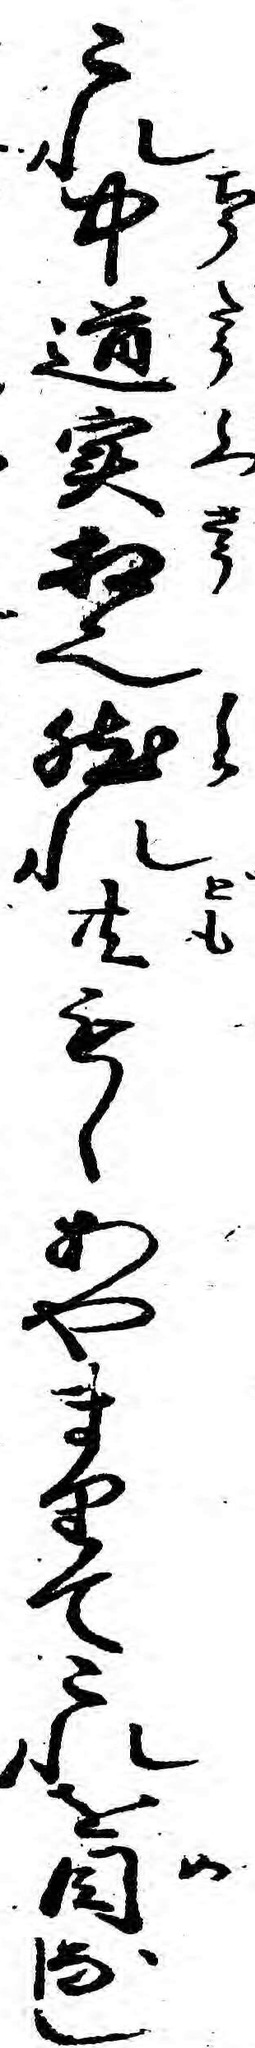これ中道実相也然れ共もしあやまりてこれを目なし
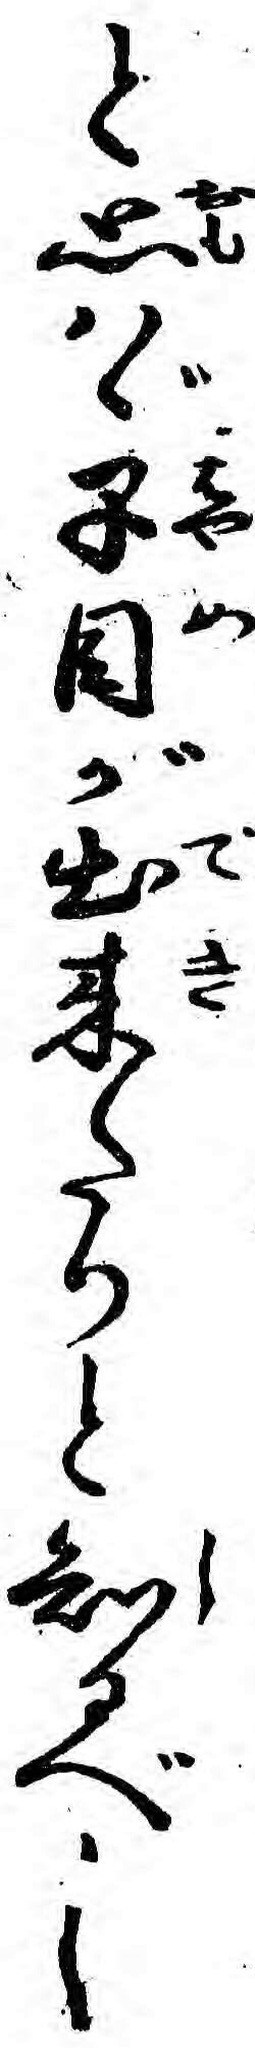と思はゞ早目が出来たりと知るべし
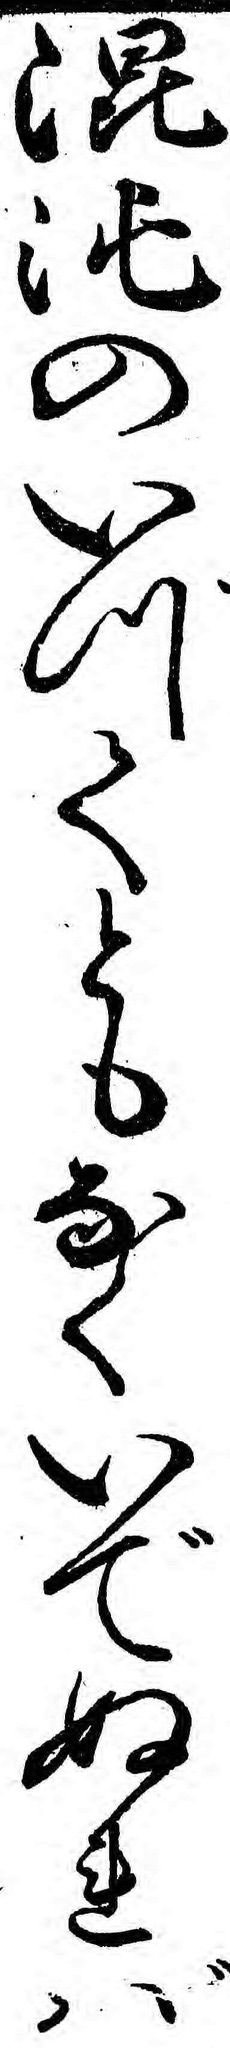混沌のいづくともなくいでぬれば
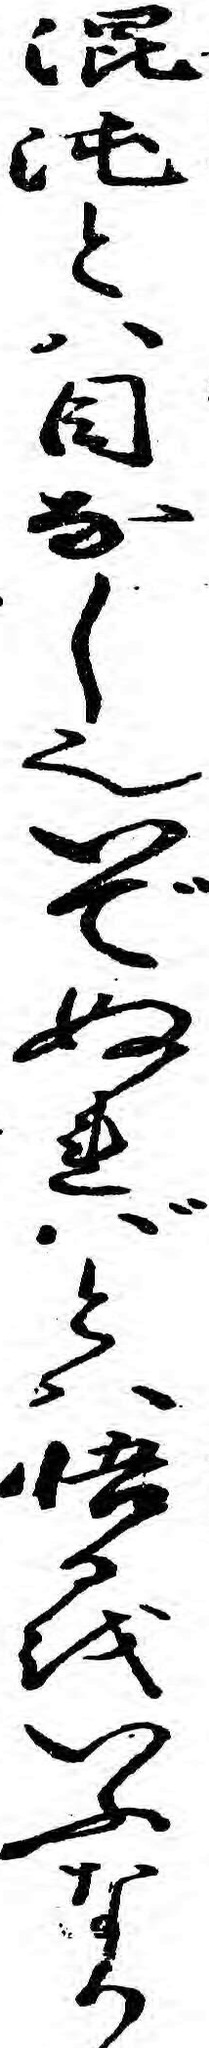混沌とは目なし也いでぬればとは悟るをいふなり
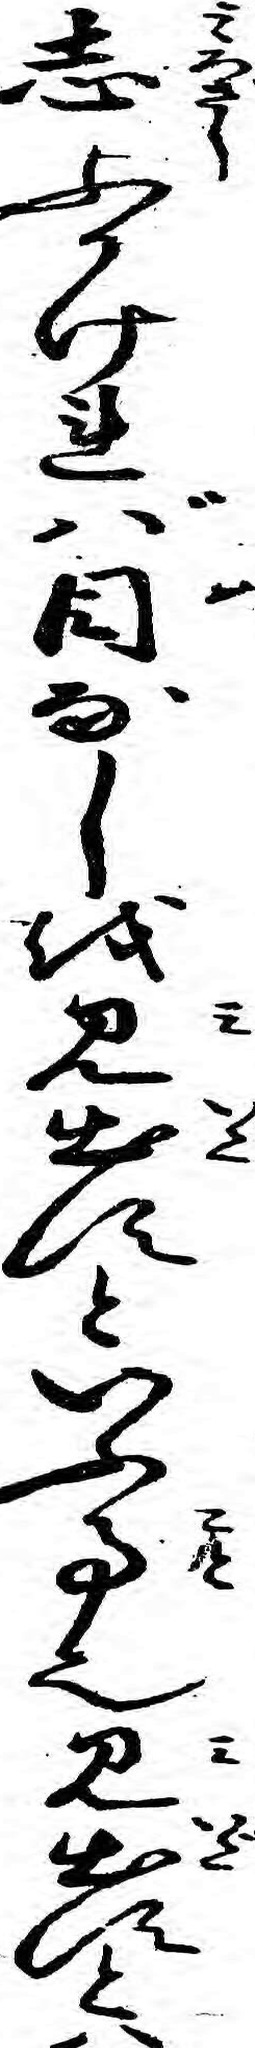志ふかければ目なしを見出すといふ事也見出すとは
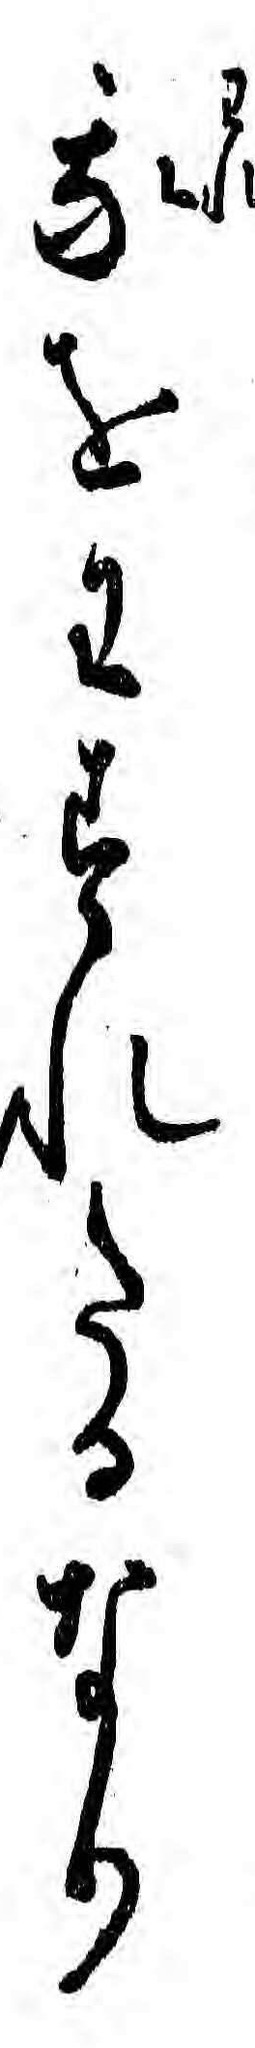我をわすれたるなり
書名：目なし用心抄
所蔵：国文学研究資料館
